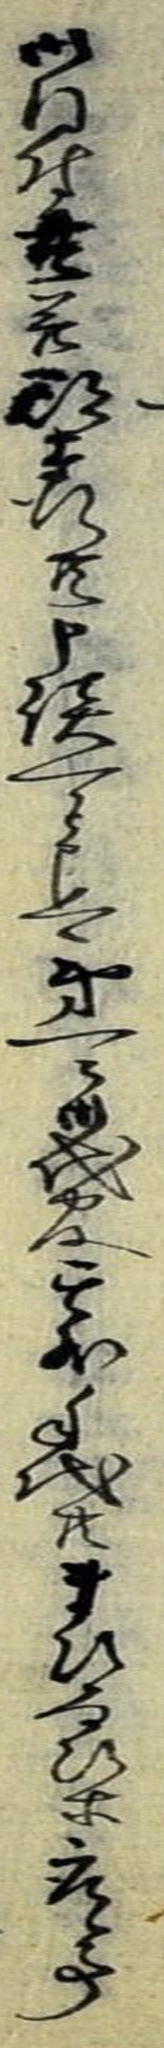御目付共并郡奉行共申談可被申上候第一に御代官其外手代共まひなひ等取候事
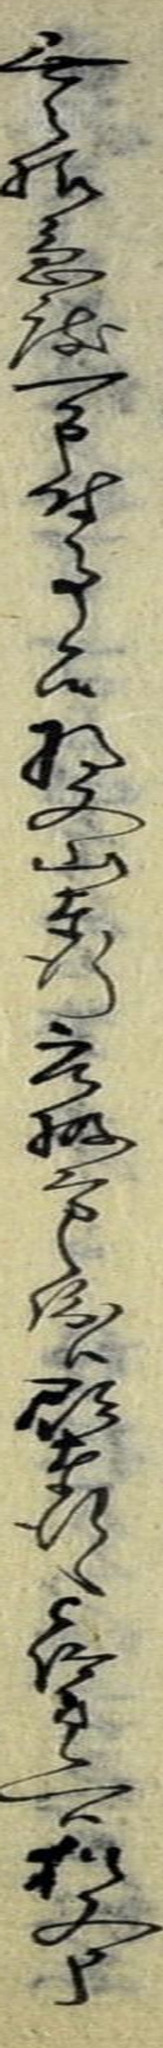無之様急度可申付事に候将又山奉行取扱方之儀は郡奉行へ被仰付候へは猶又申
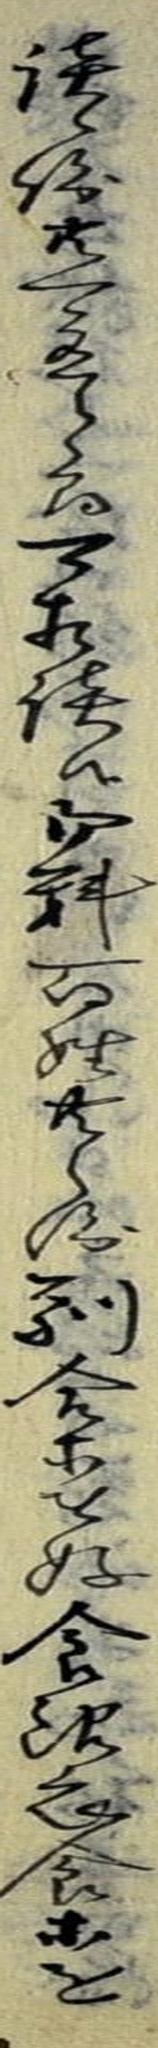談候儀共可有之候間可相談候御料百姓共之儀馴合等を好食銀衣食等を
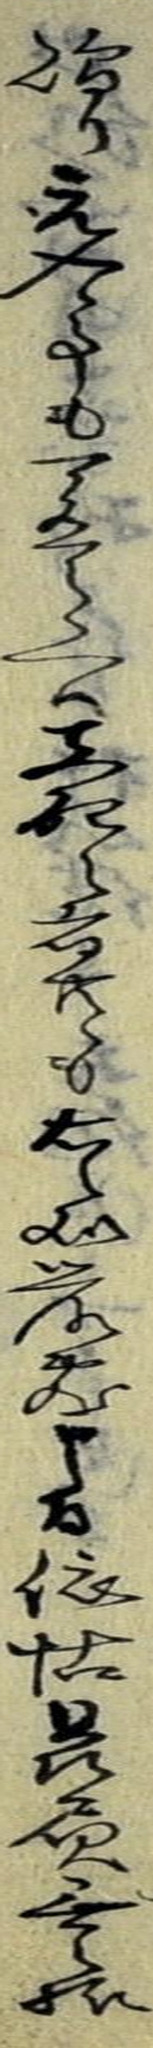贈り取入候事も可有之候へは支配之者共へも右之処厳敷申付依怙贔屓無之様
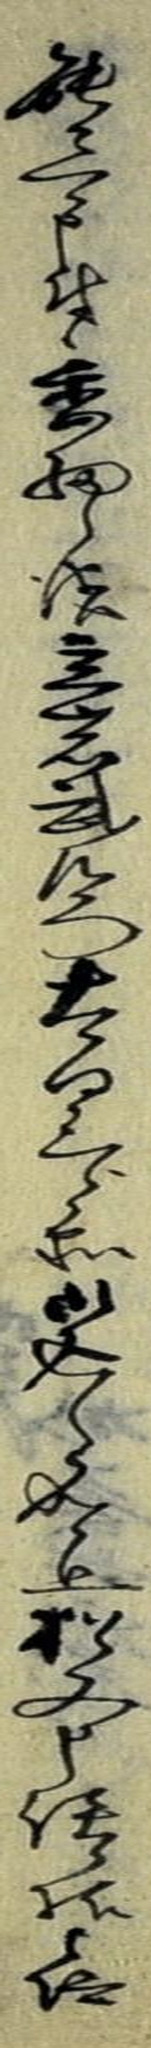能々可申付候委細之儀は立岩武左衛門太田三郎兵衛御返し被成候上猶又申談候様被仰
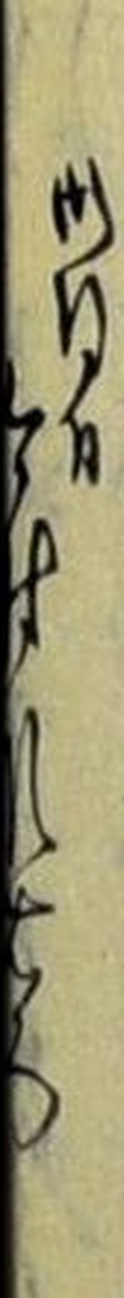御目付
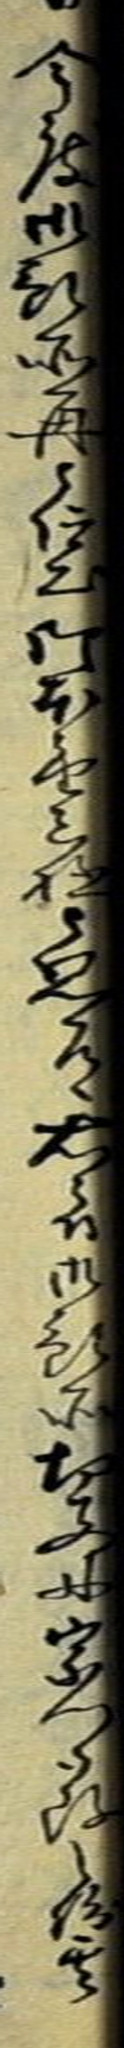〇今度御預所再被仰出御本望至極被思召候右に付御預所切支丹宗門御改之儀其
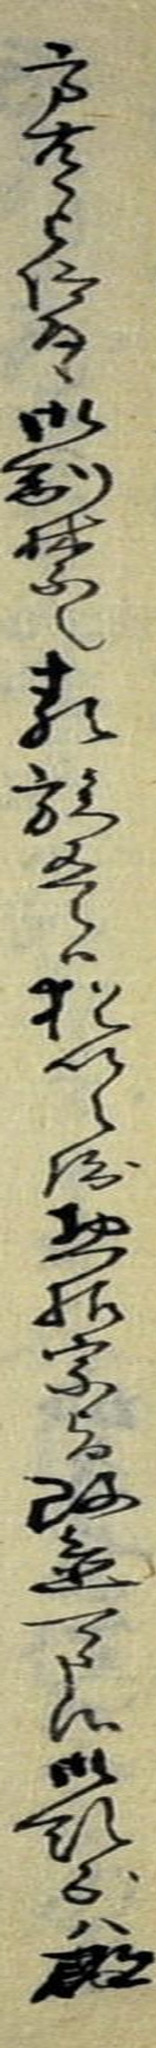方共へ被仰付候御制禁之類族有之は猶以之儀惣様宗旨改置可申候御領分は郡
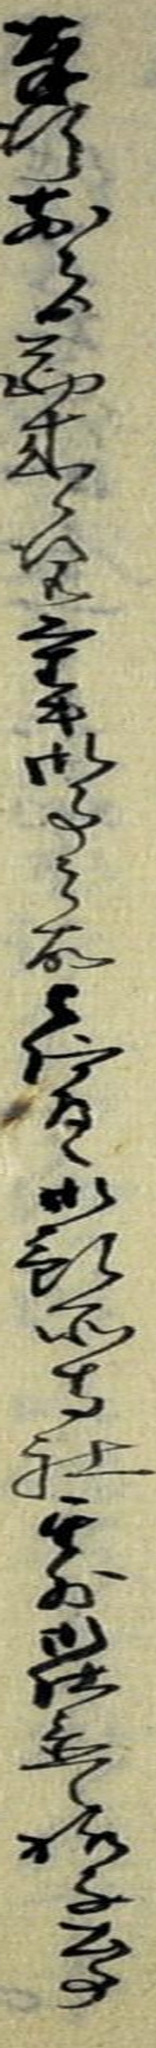奉行前々ゟ勤来候得共重き御事に候故被仰付候御預所寺社其外御仕置之様子公事
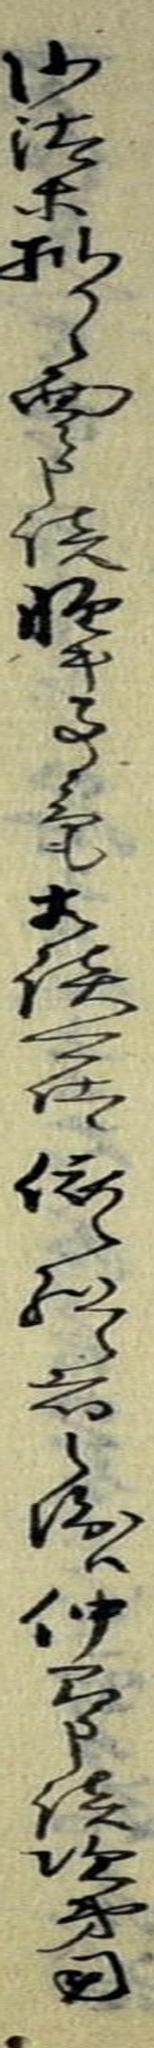沙汰等掛り之面々申談軽き事に而も相談可仕候依之組之者之儀は仲間申談次第用
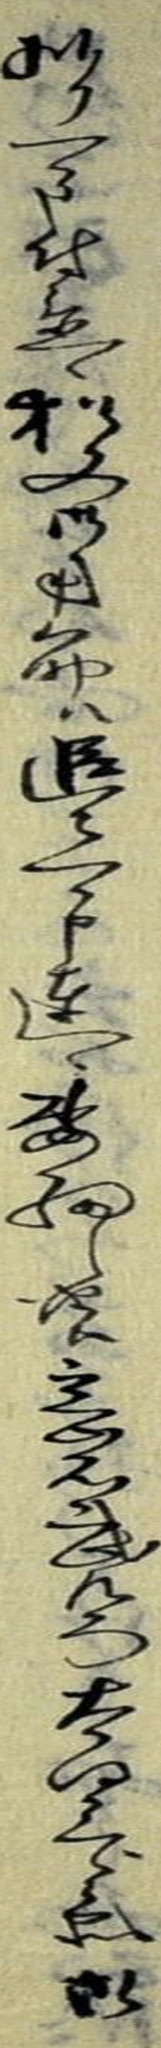掛り可申付置候猶又御用筋は追々可申達候委細之儀は立岩武左衛門太田三郎兵衛御
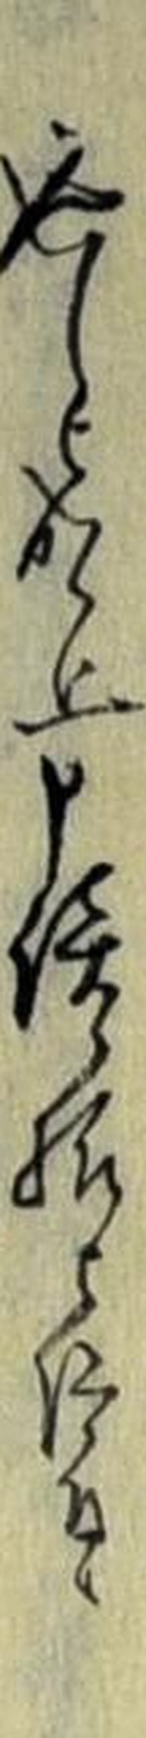返し被成候上申談候様被仰付候
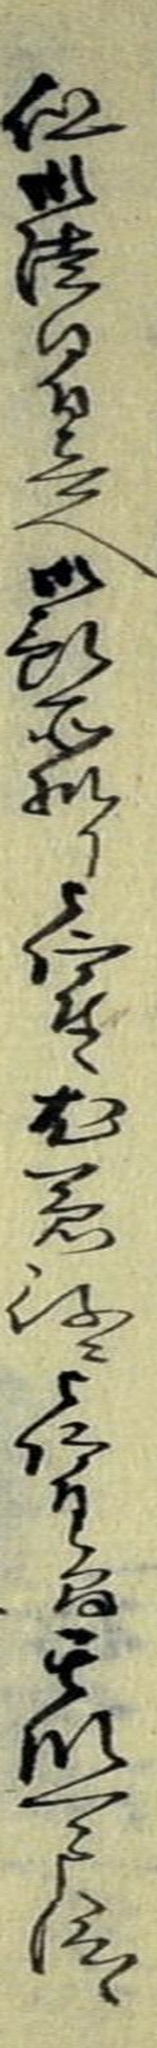但御徒目付壱人御預所掛り被仰付候尤兼役に被仰付候間其段可申渡候
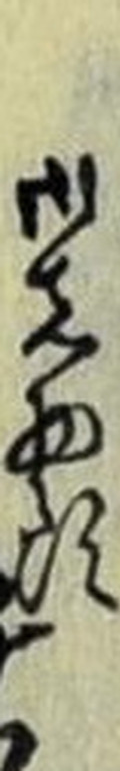御先物頭
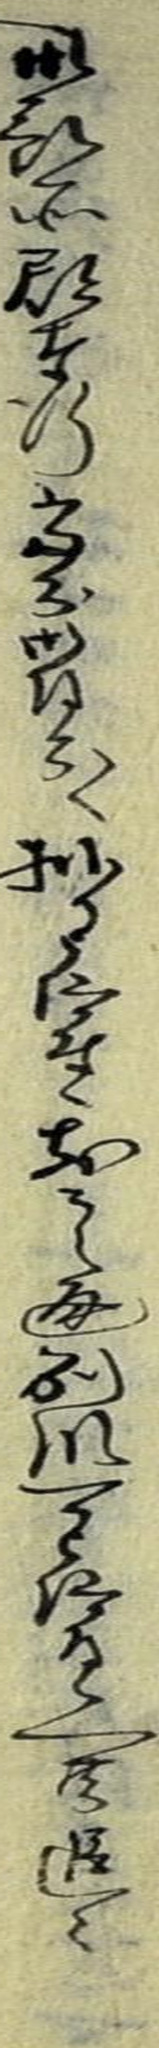御預所郡奉行当分御自分へ掛り被仰付候前々之通別段可被仰付候へ共追々
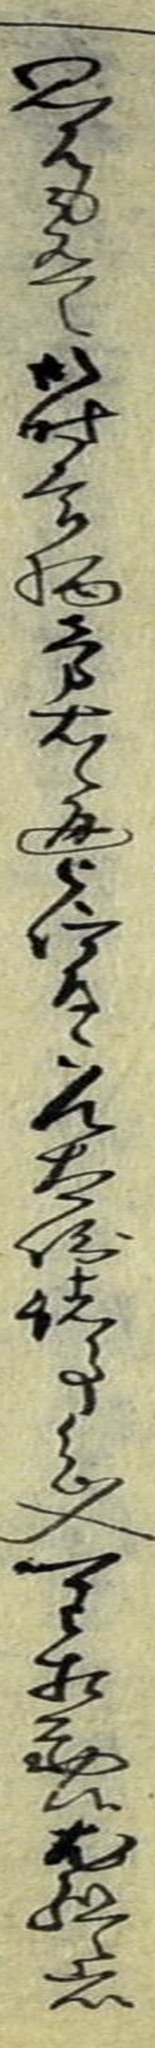思召も有之御時節柄旁右之通被仰付候乍太儀諸事念入可被相勤候尤組之者
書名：命令之部 二
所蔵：福井県文書館 Fukui Prefectural Archives
